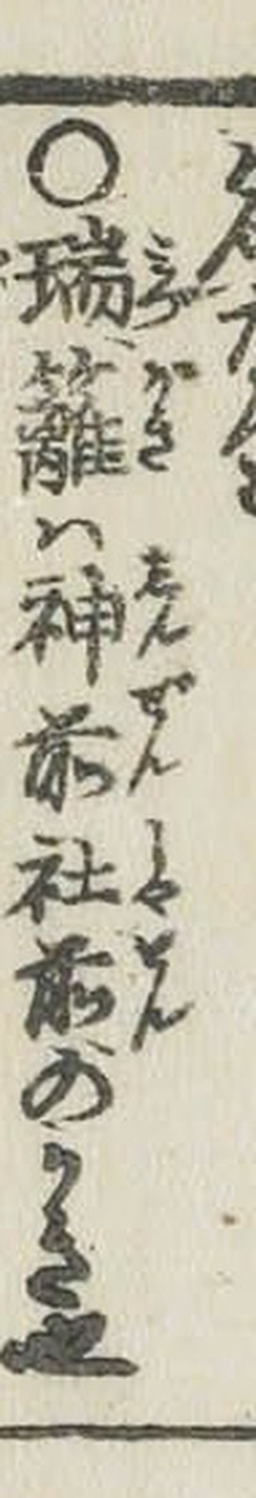○瑞籬は神前社前のかき也
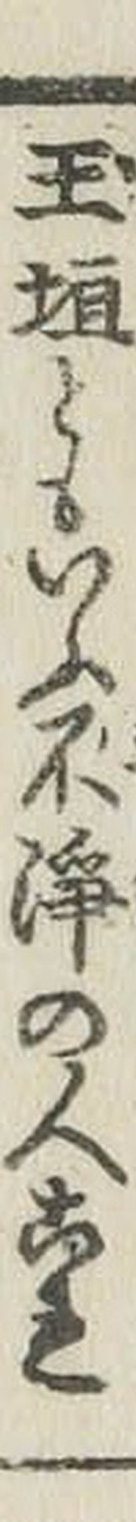玉垣ともいふ不浄の人これ
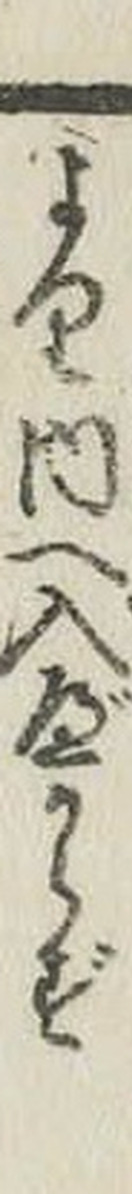より内へ入べからず
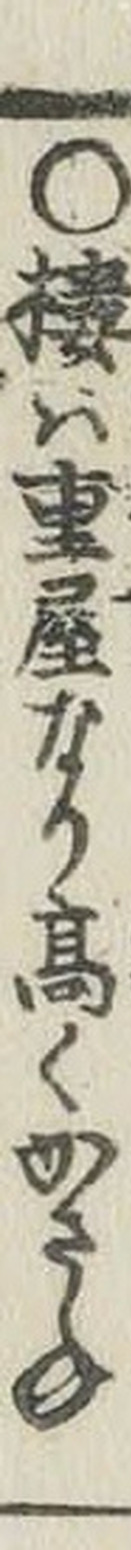○楼は重屋なり高くかさね
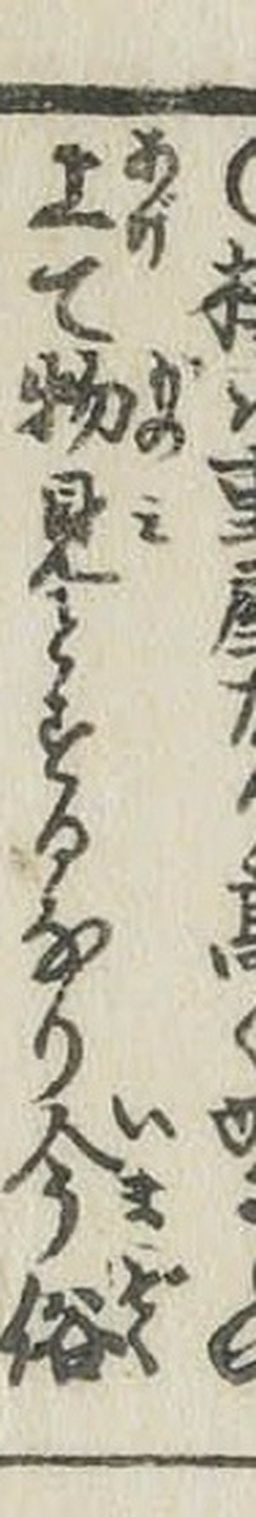上て物見をするなり今俗
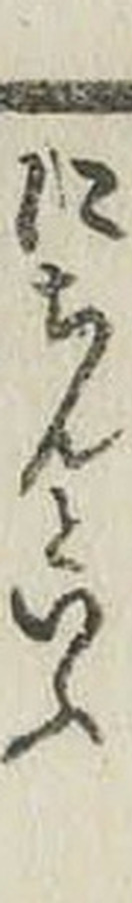にちんといふ
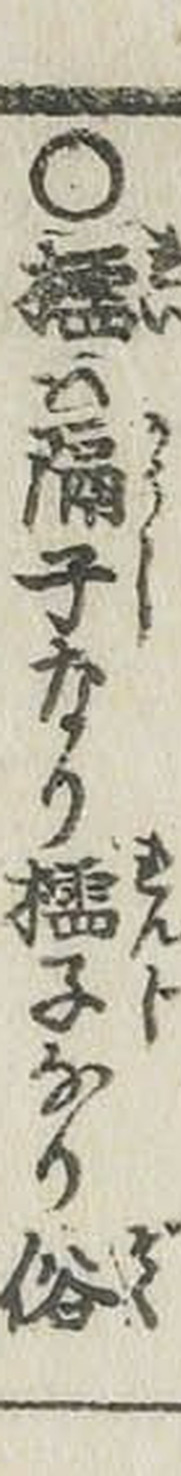○櫺は隔子なり櫺子なり俗
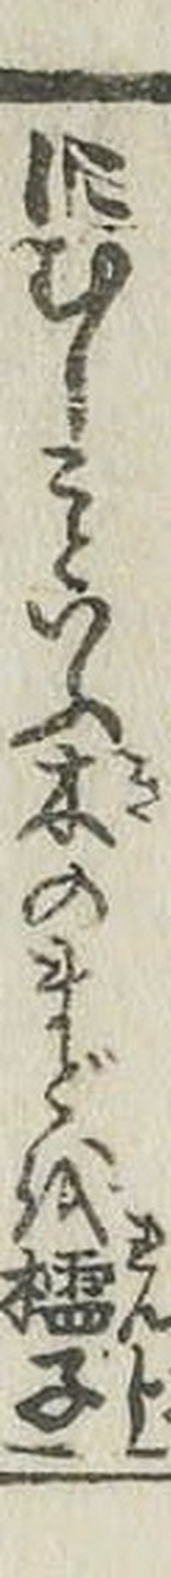にむしこといふ木のまどを櫺子
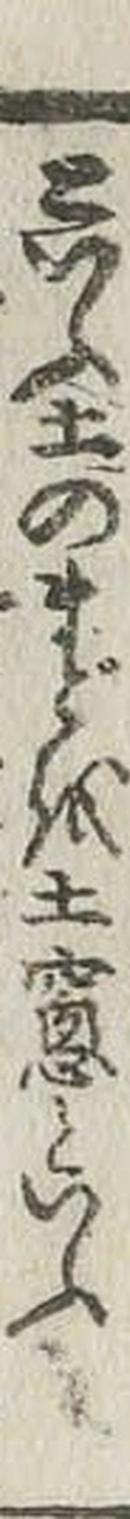といふ土のまどを土窓といふ
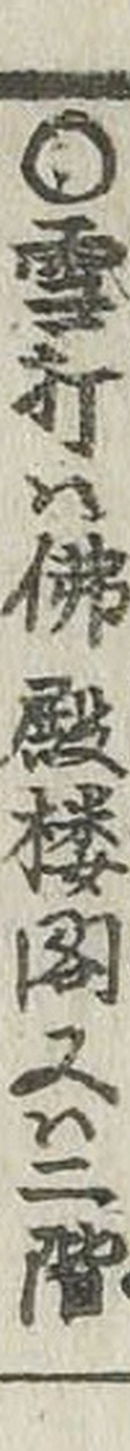○雪打は仏殿楼閣又は二階
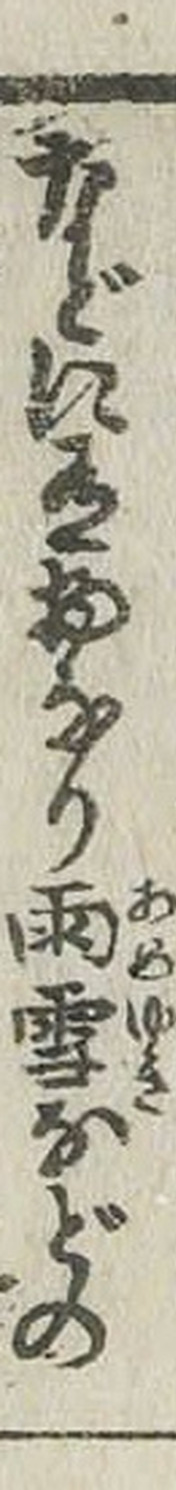などに有物なり雨雪などの
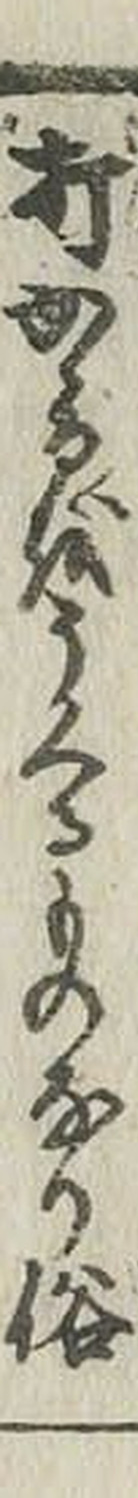打かゝるをうくるものなり俗
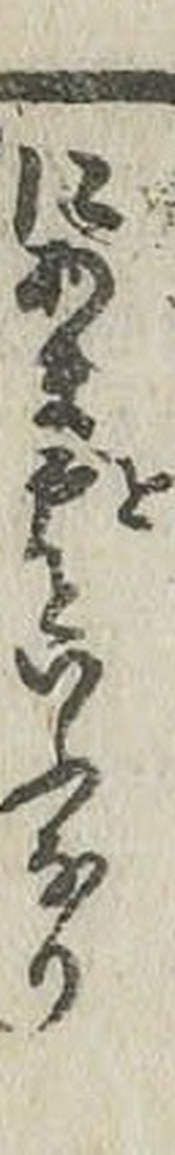にあま戸といふなり

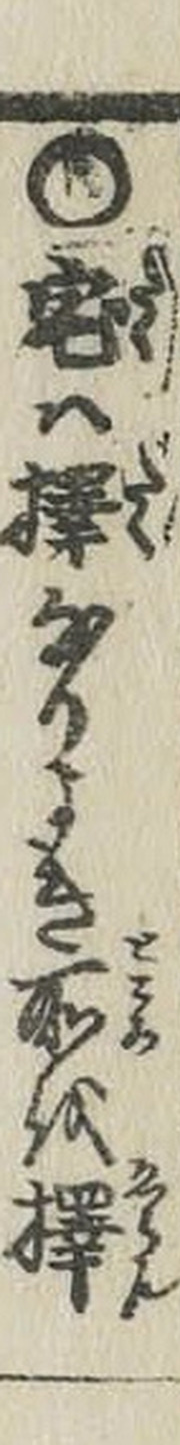○宅は択なりよき所を択
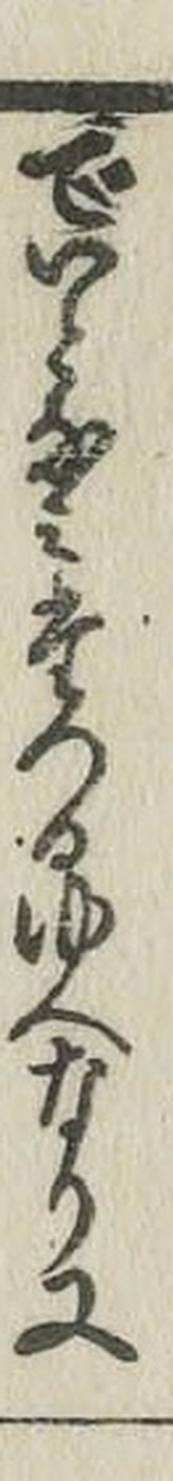でいとなみたつるゆへなり又
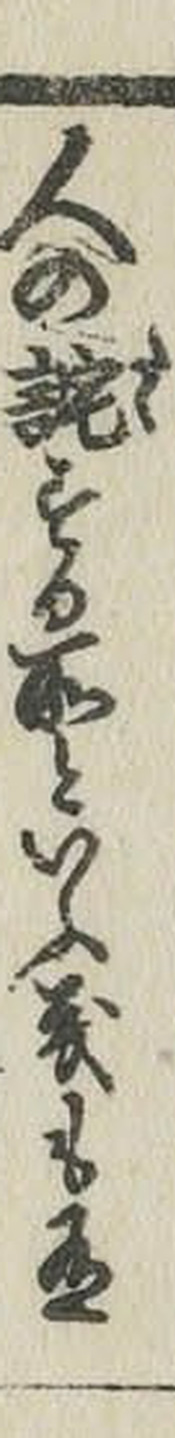人の詫する所といふ義も有
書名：増補頭書訓蒙図彙大成 10巻 2:巻之1-3
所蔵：東京学芸大学教育コンテンツアーカイブ
